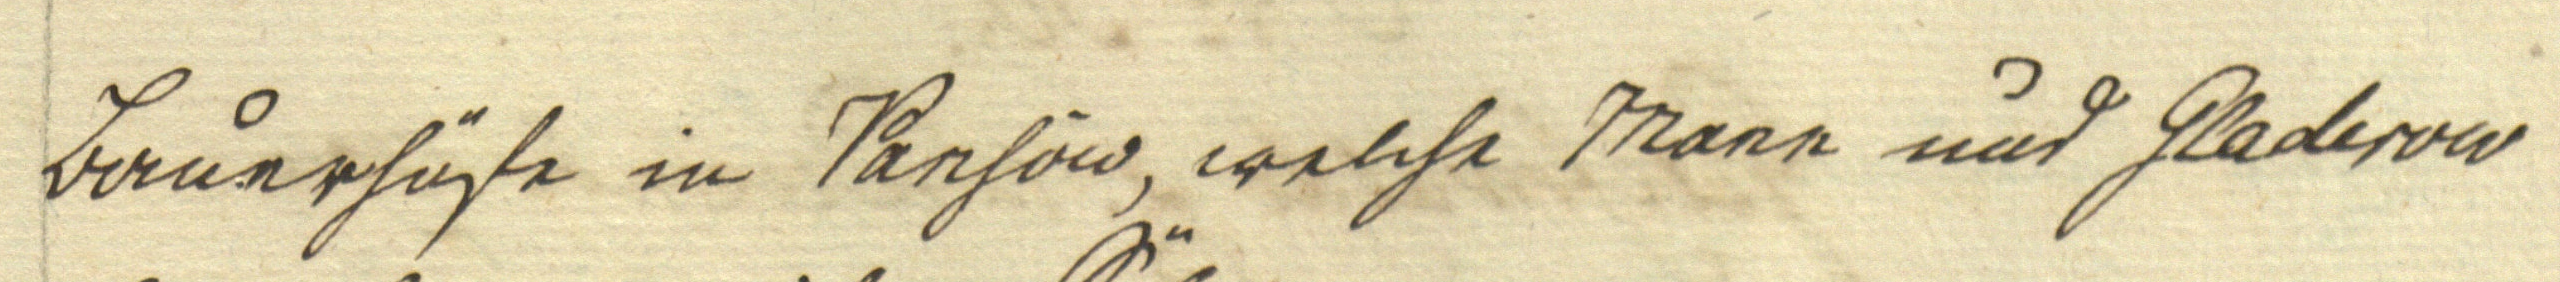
Bauerhöfe in Pansow welche, Mann und Gladerow
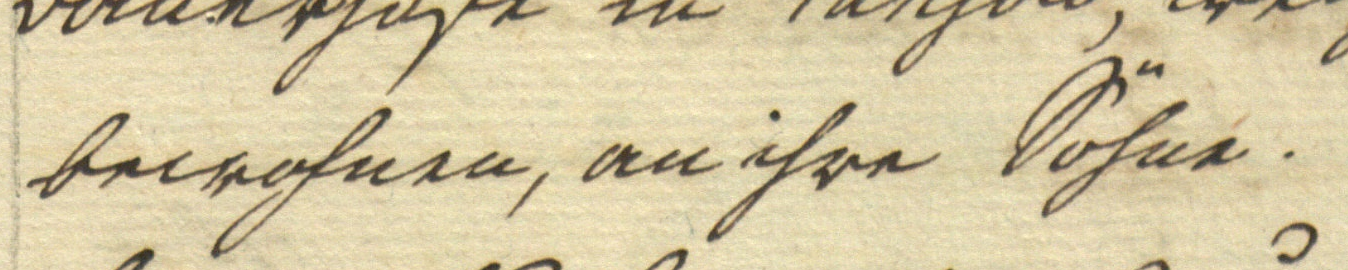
bewohnen, an ihre Söhne.
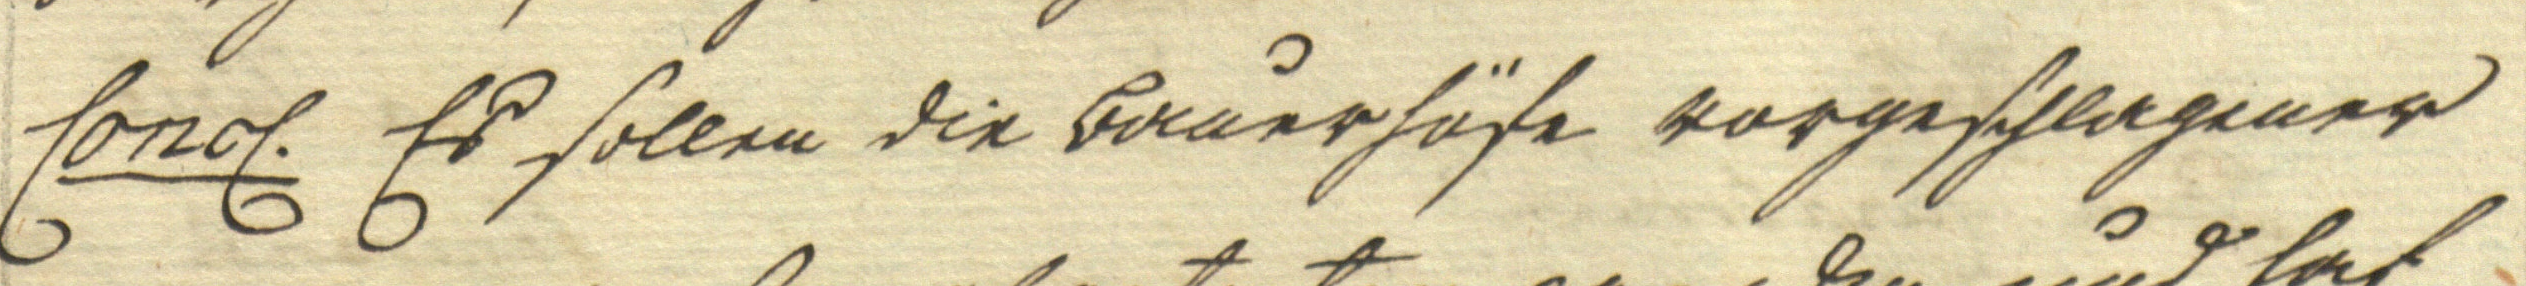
Concl. Es sollen die Bauerhöfe vorgeschlagener
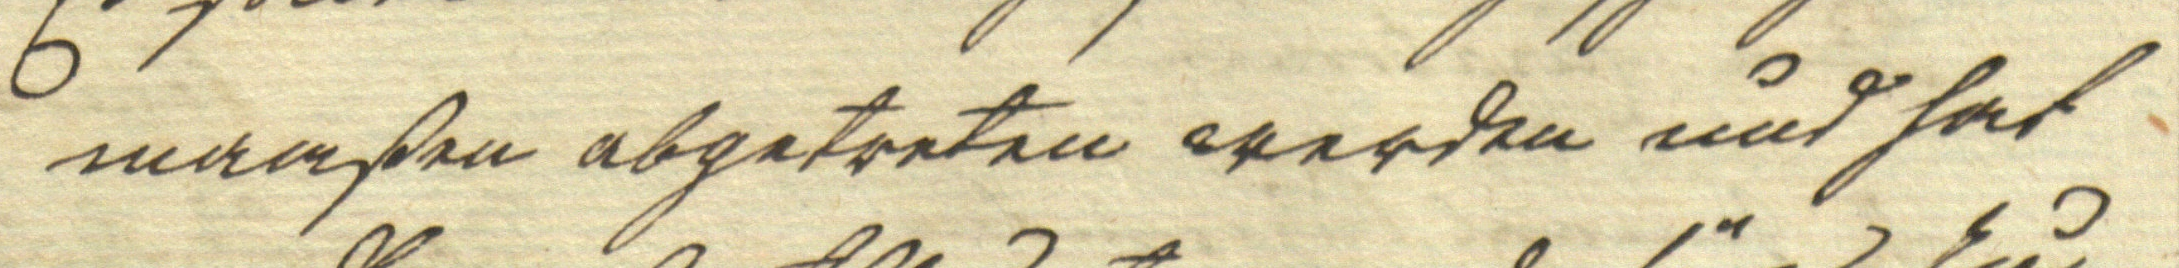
maaßen abgetreten werden und hat
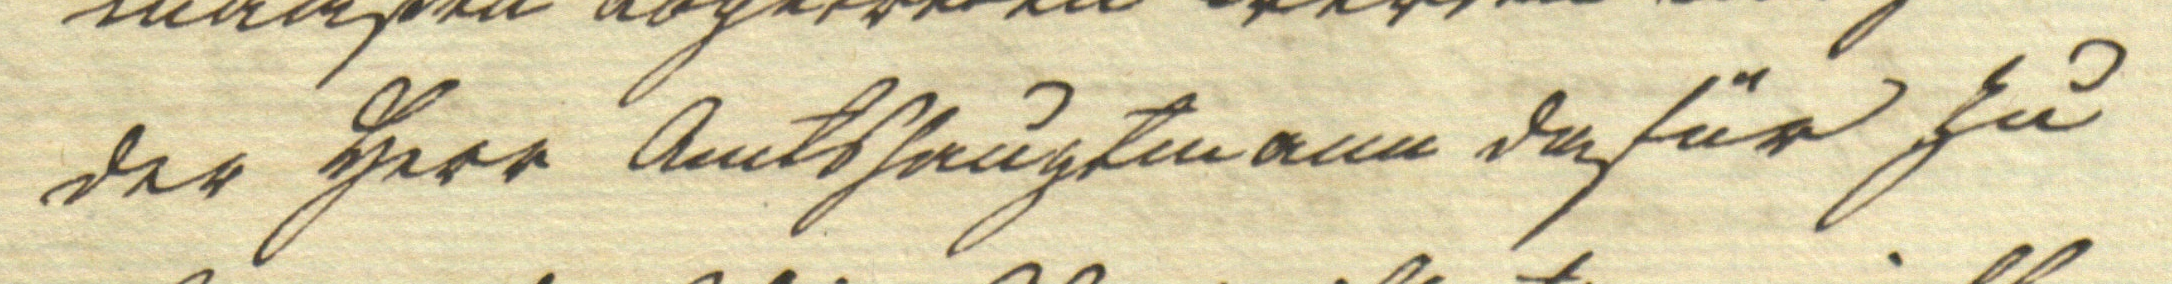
der Herr Amtshauptmann dafür zu
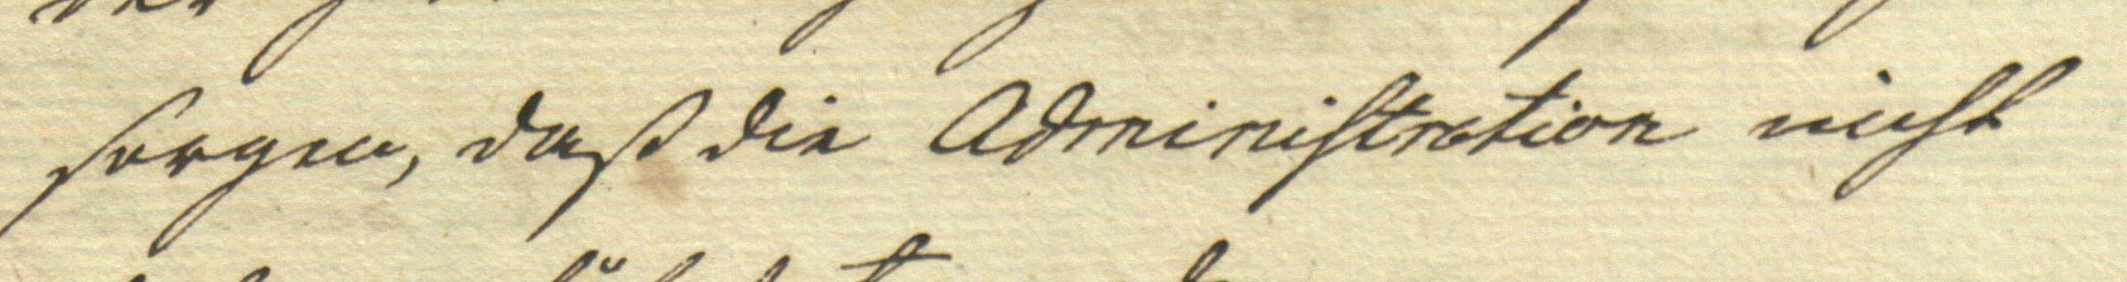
sorgen, daß die Administration nicht
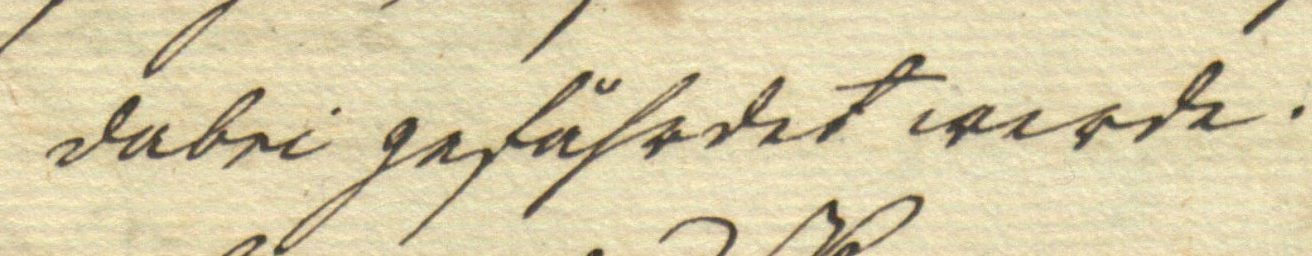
dabei gefährdet werde.
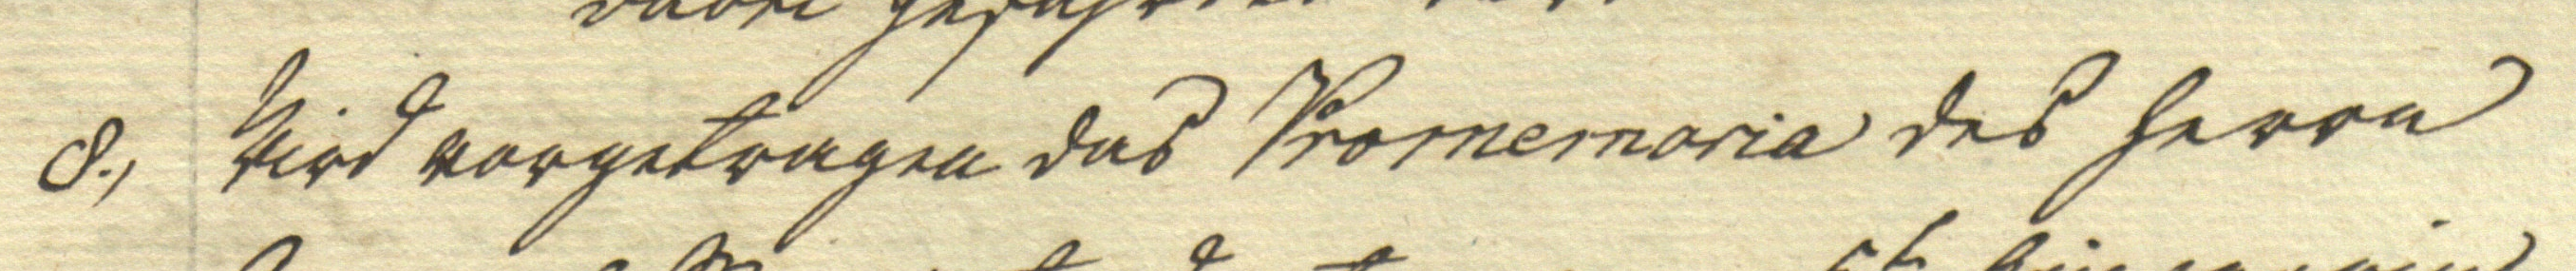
8., Wird vorgetragen das Promemoria des Herrn
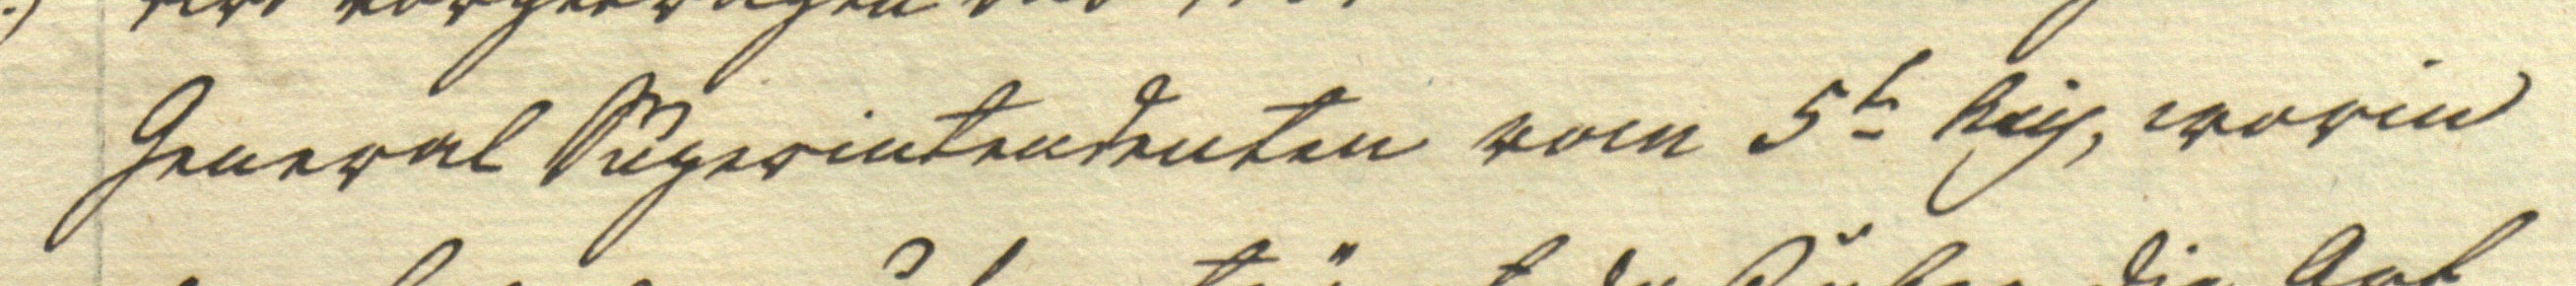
General Superintendenten vom 5 t huj. worin
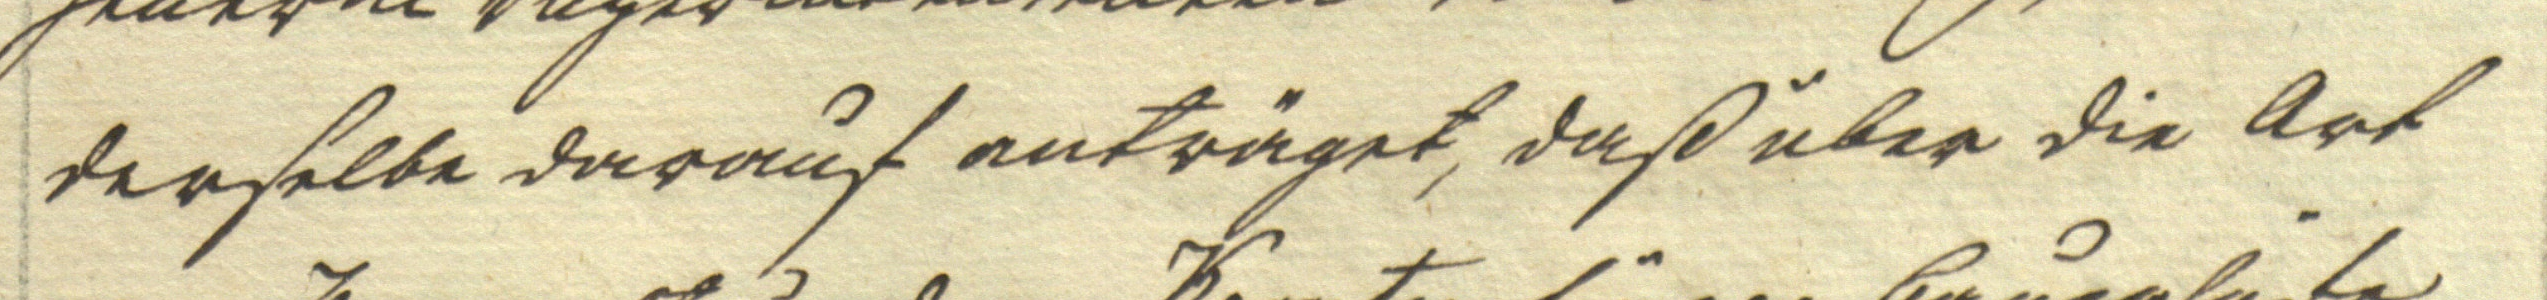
derselbe darauf anträget, daß über die Art
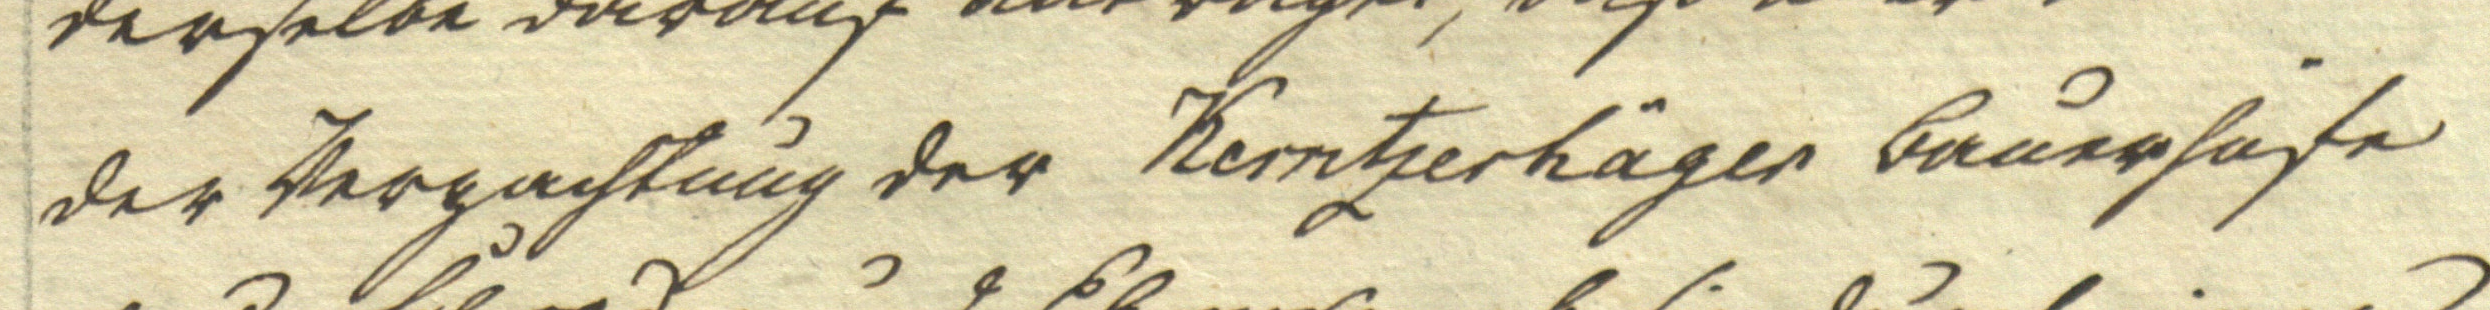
der Verpachtung der Kemtzerhäger Bauerhöfe
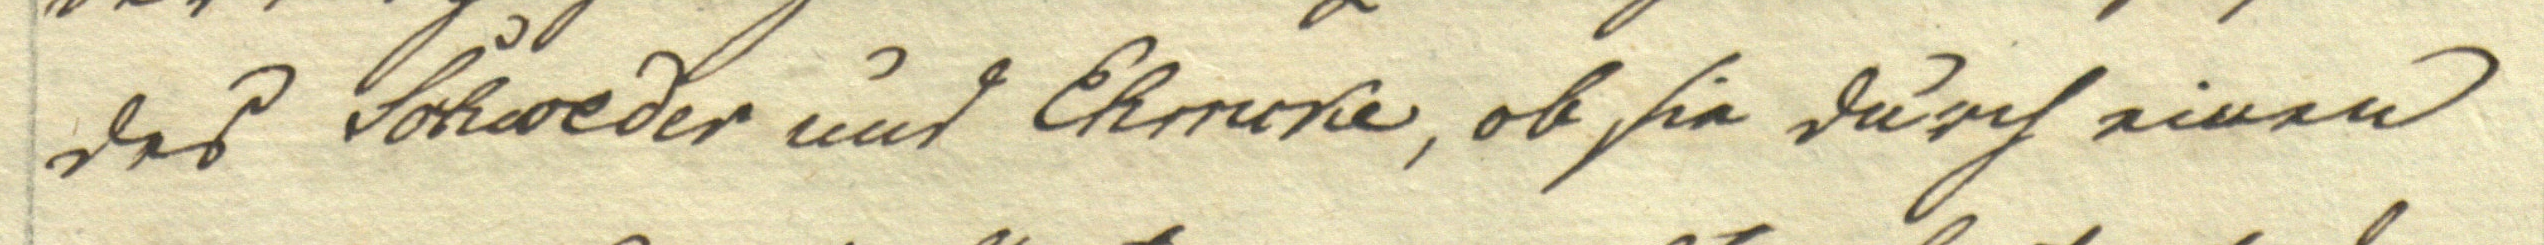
des Schweder und Ehmcke, ob sie durch einen
